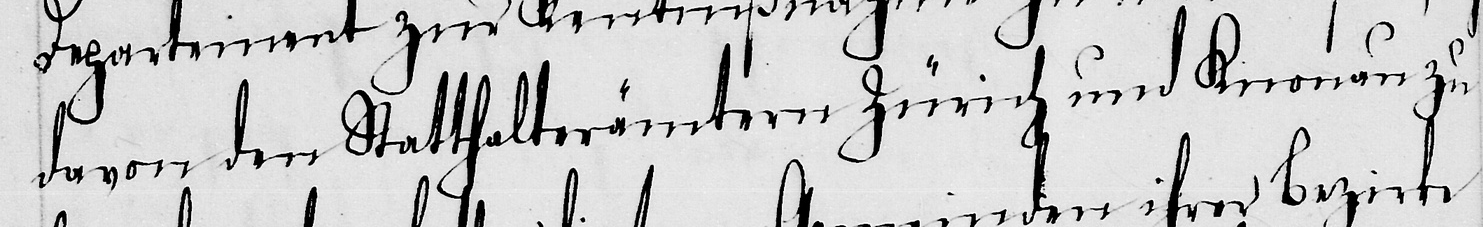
davon den Statthalterämtern Zürich und Knonau zu
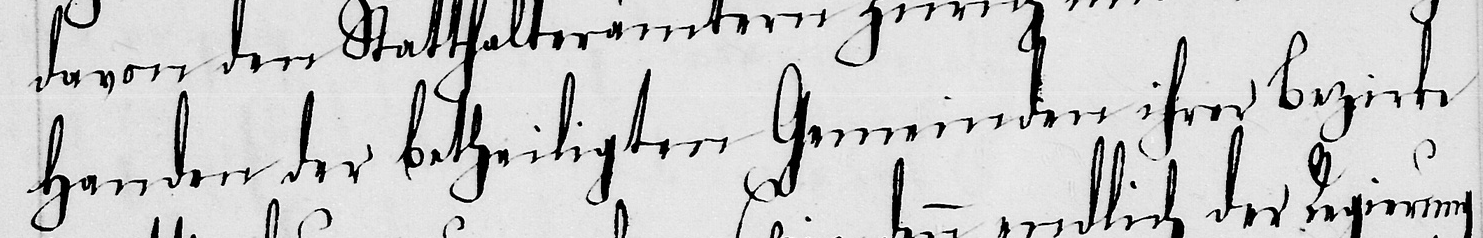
Handen der betheiligten Gemeinden ihrer Bezirke
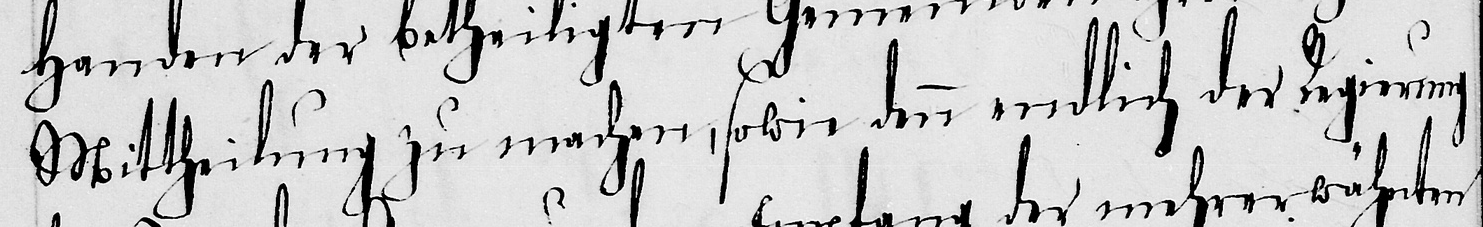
Mittheilung zu machen, sowie denn endlich der Regierung
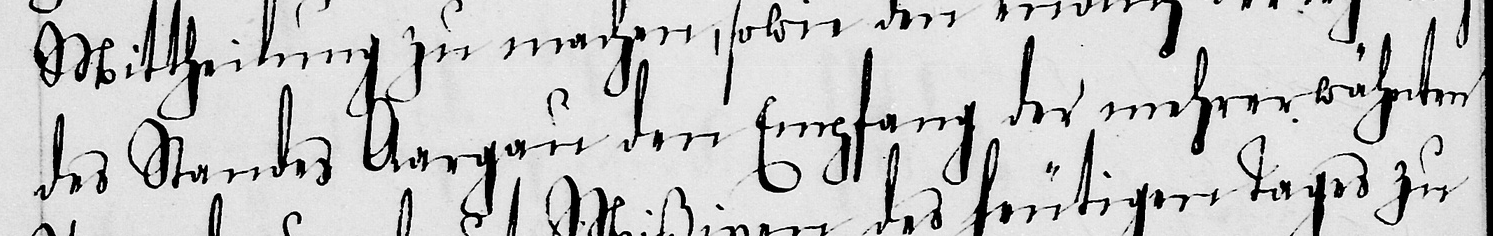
des Standes Aargau den Empfang der mehrerwähnten
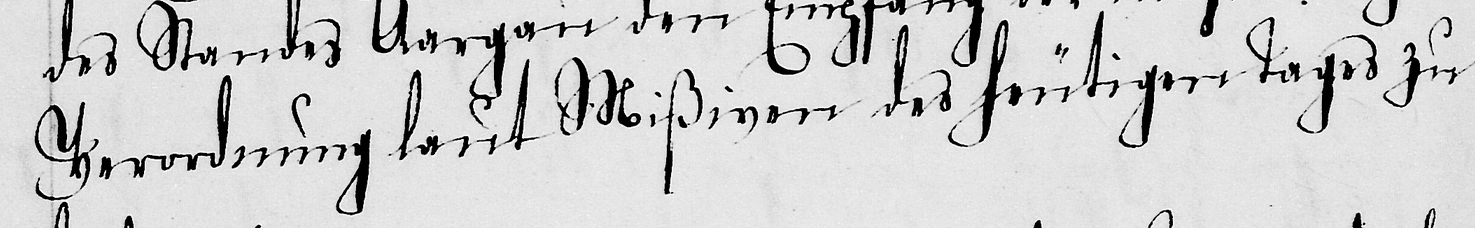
Verordnung laut Mißiven des heutigen Tages zu
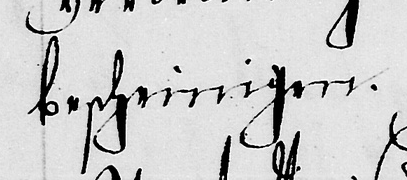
bescheinigen.
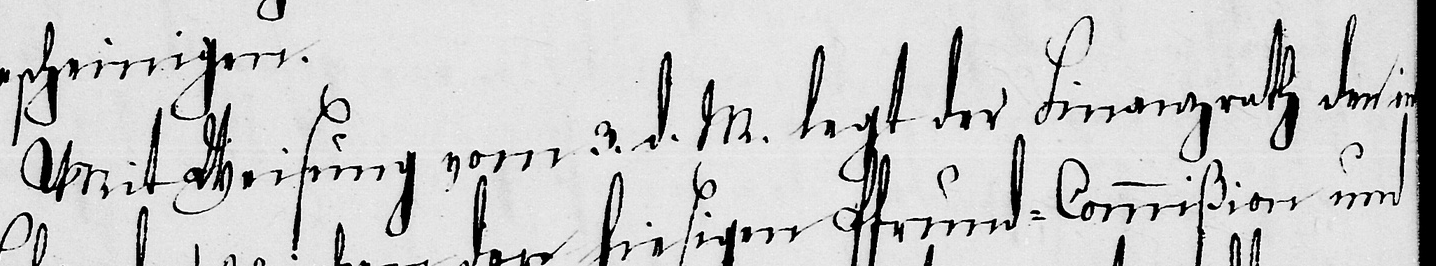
Mit Weisung vom 3. d. M. legt der Finanzrath den
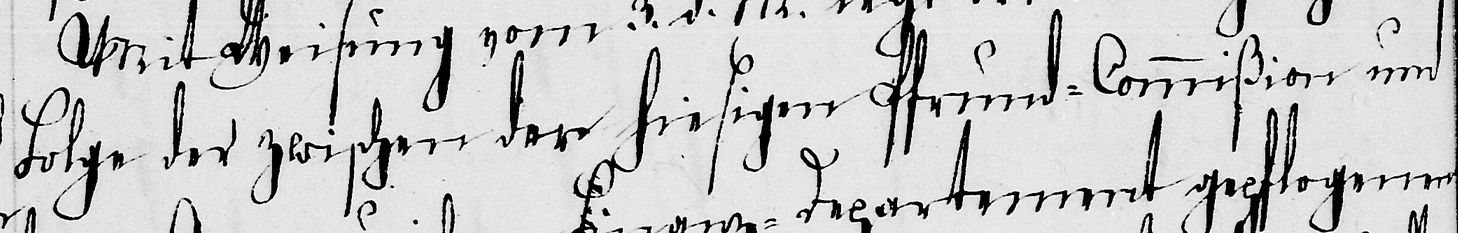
Folge der zwischen der hiesigen Pfrund-Commißion und
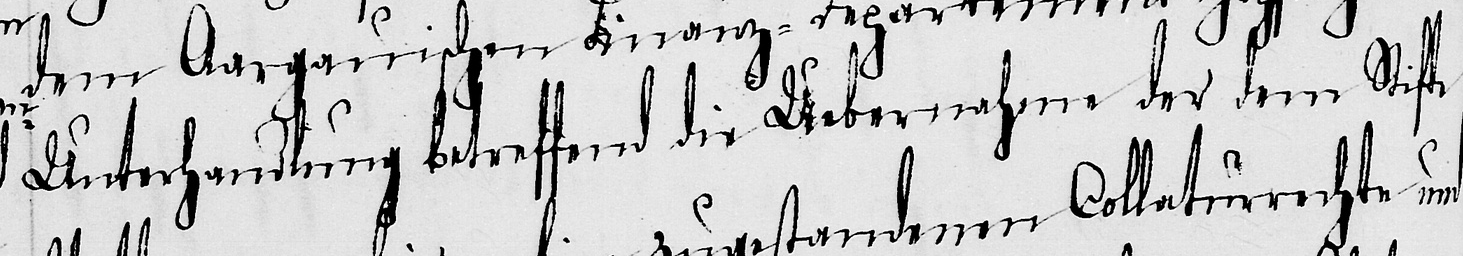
Unterhandlung betreffend die Uebernahme der dem Stifte
